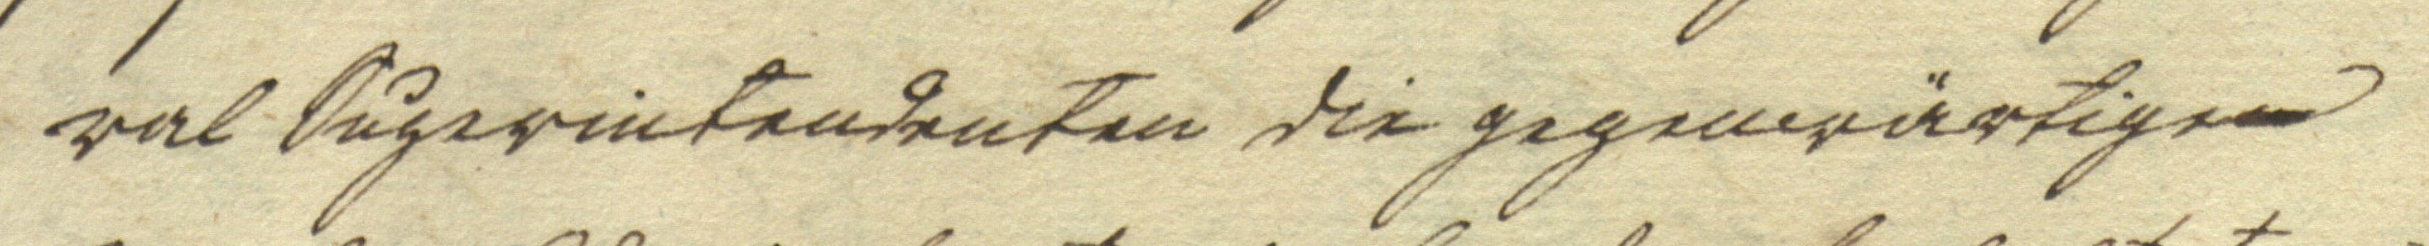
ral Superintendenten die gegenwärtigen
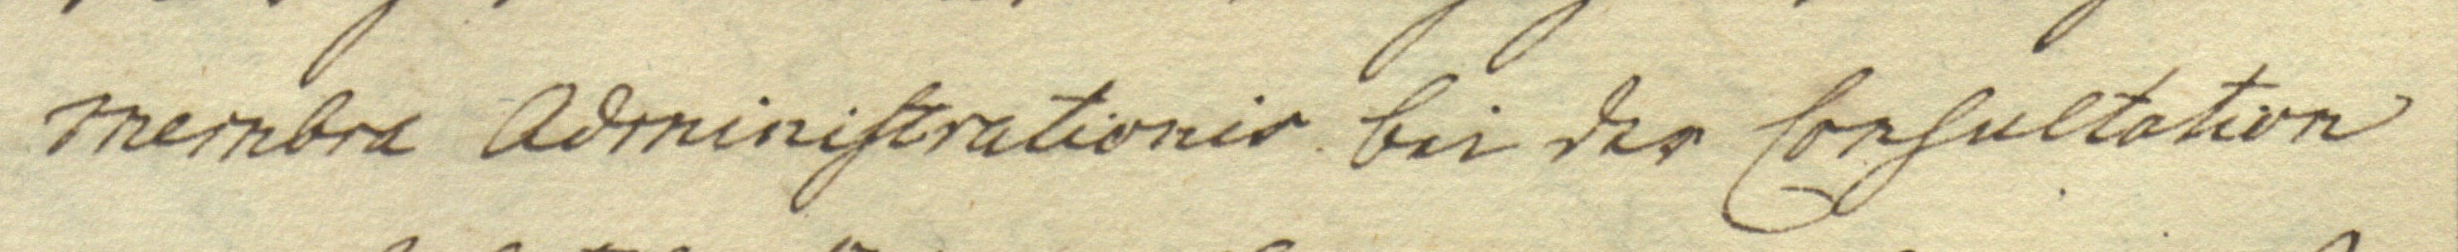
membra Administrationis bei der Consultation
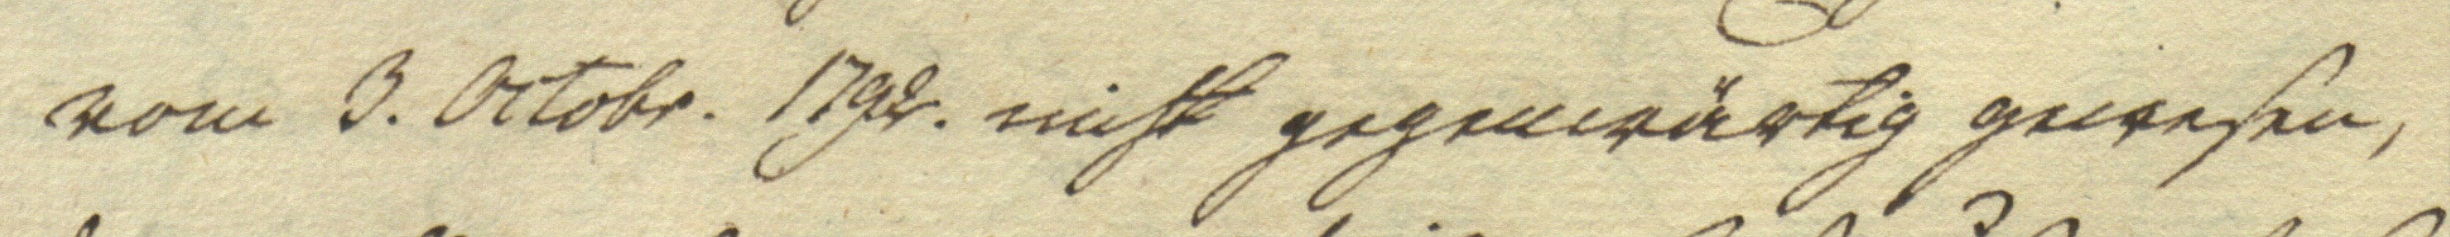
vom 3. Octobr. 1792. nicht gegenwärtig gewesen,
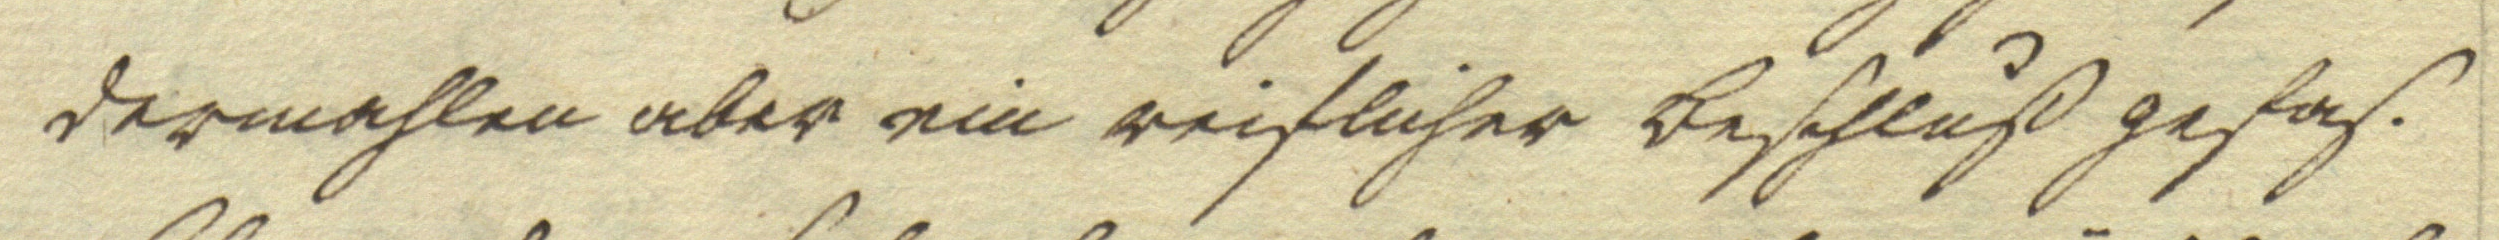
dermahlen aber ein reiflicher Beschluß gefas¬
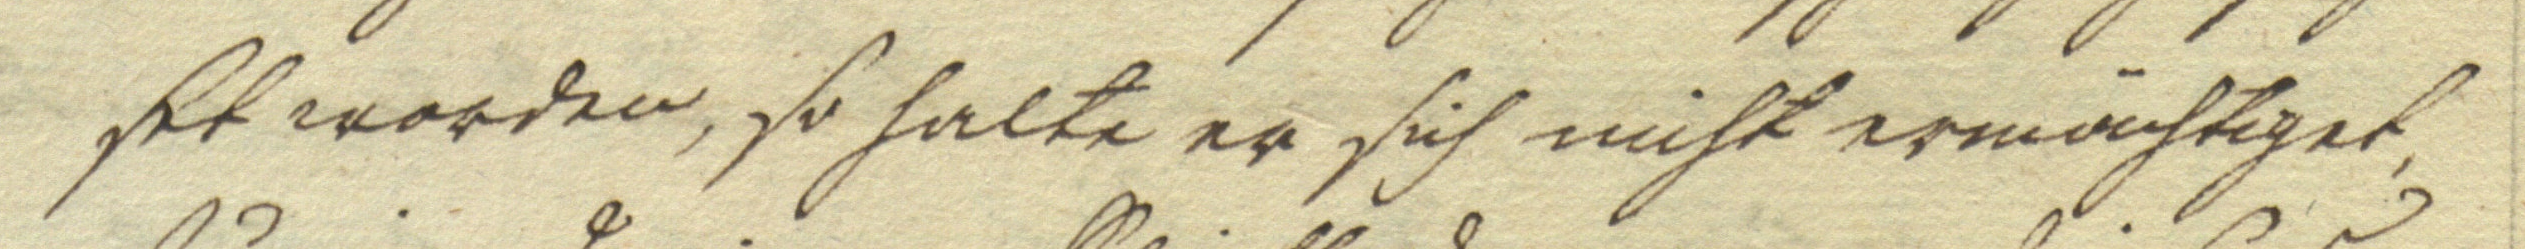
set worden, so halte er sich nicht ermächtiget,
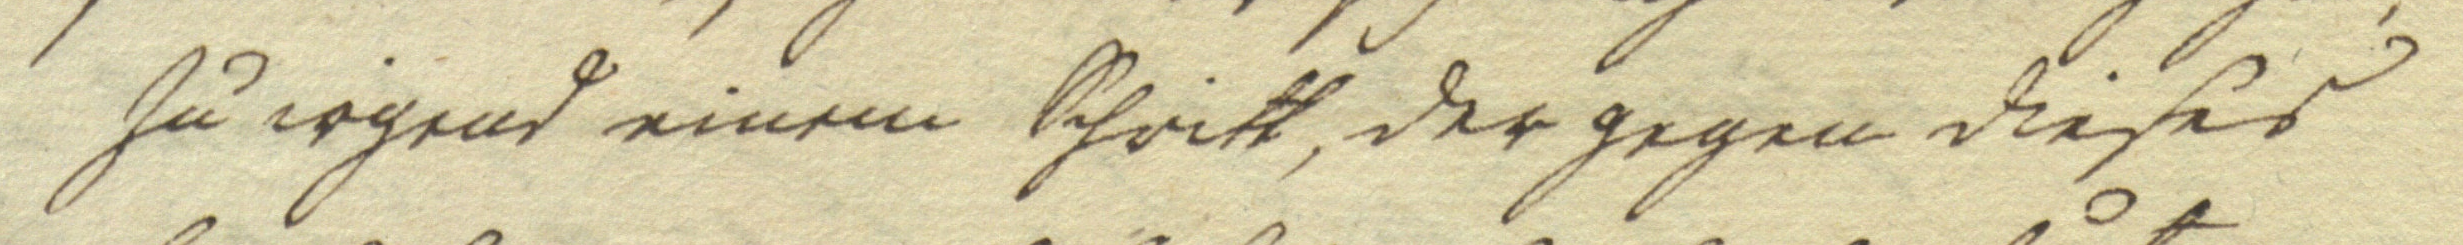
zu irgend einem Schritt, der gegen dieses
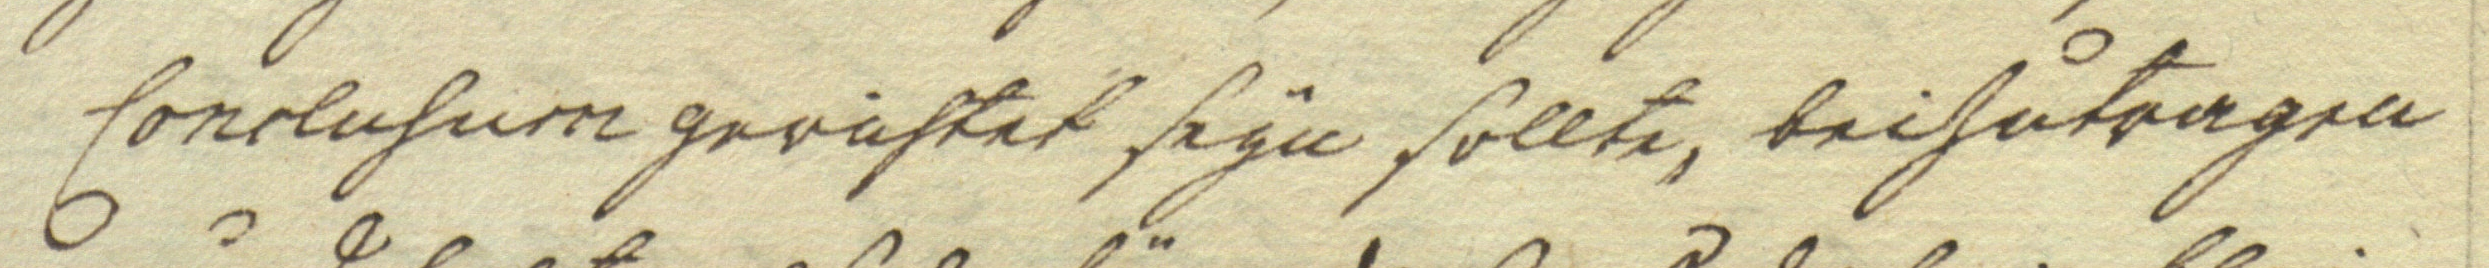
Conclusum gerichtet seÿn sollte, beizutragen
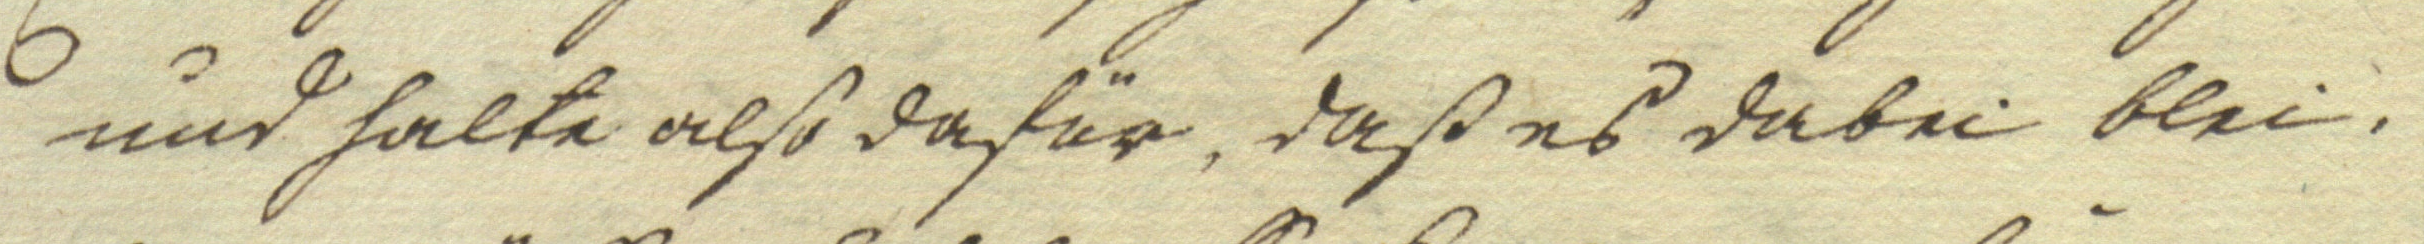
und halte als dafür, daß es dabei blei¬
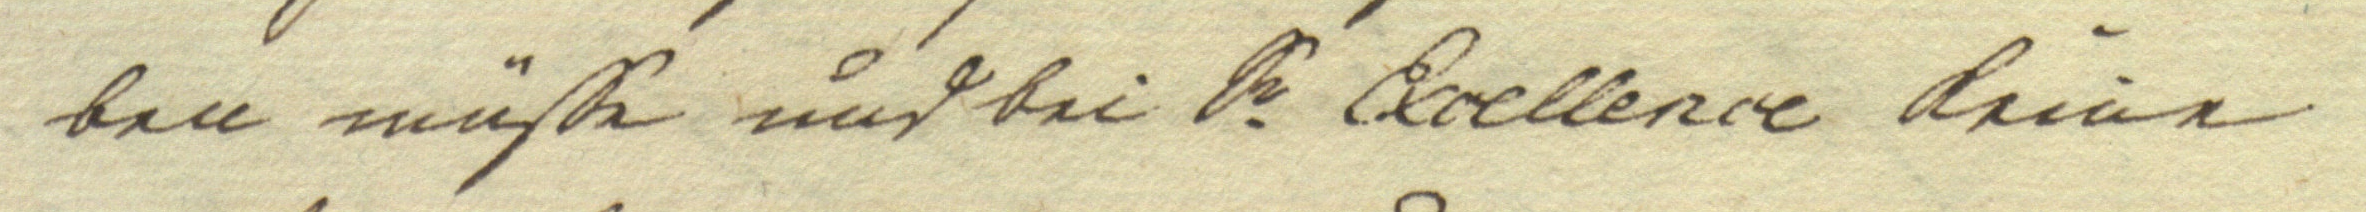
ben müsse und bei Sr Excellence keine
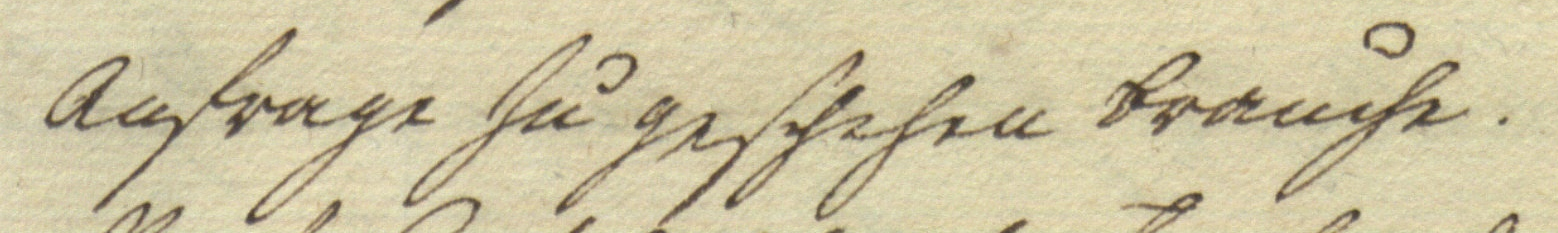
Anfrage zu geschehen brauche.
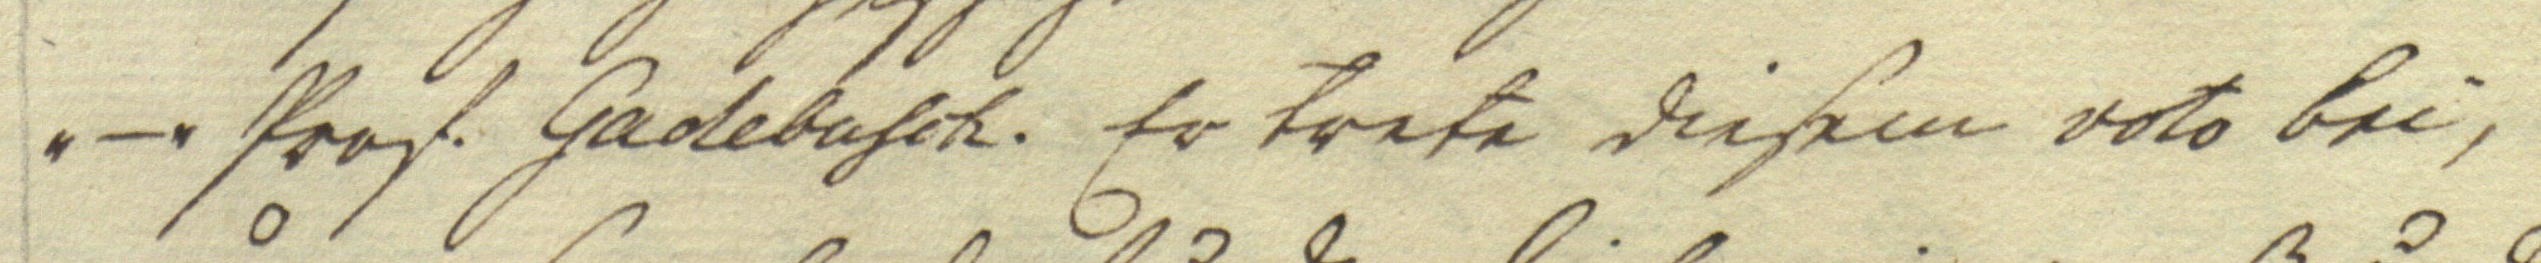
Prof. Gadebusch. Er trete diesem voto bei,
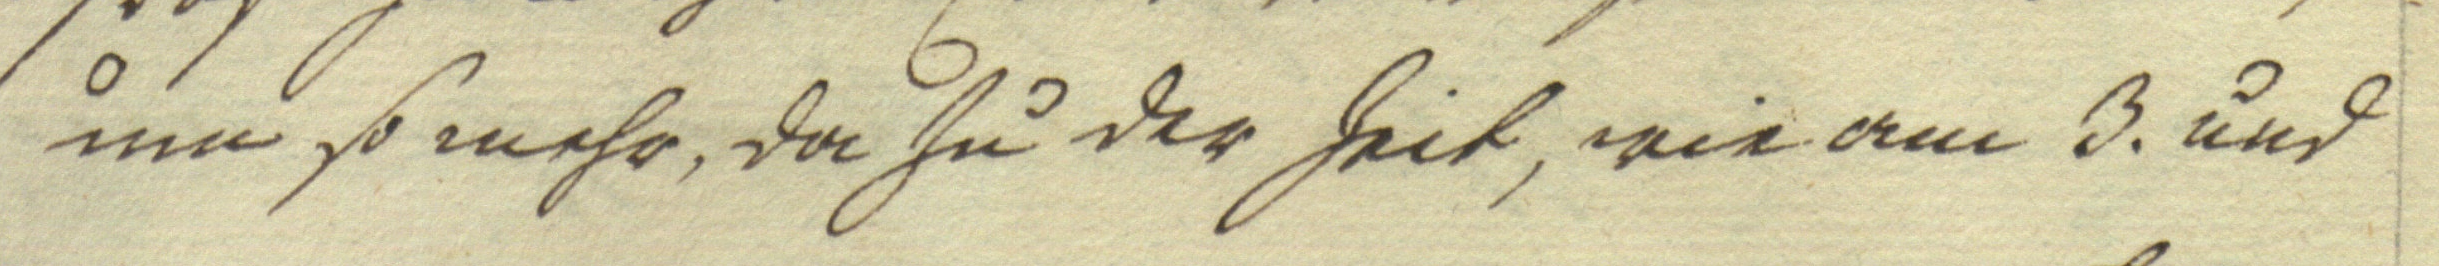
um so mehr, da zu der Zeit, wie am 3. und
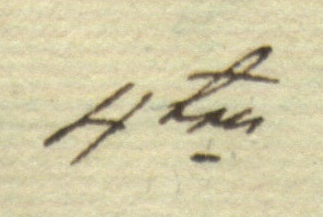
4 ten
